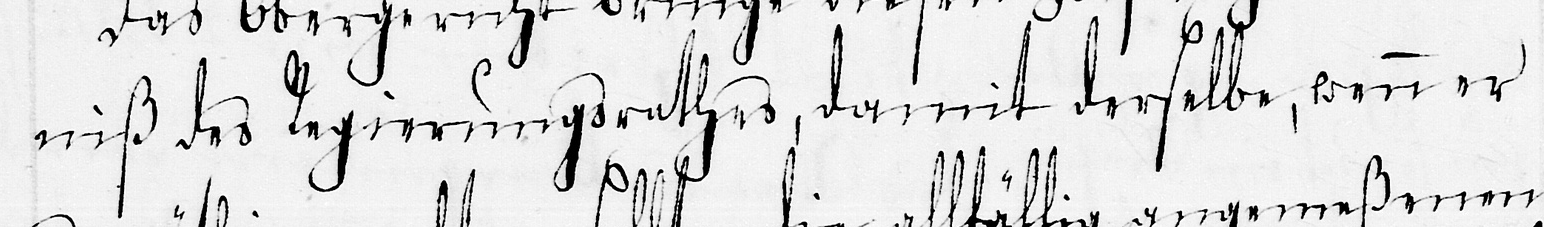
niß des Regierungsrathes, damit derselbe, wenn er
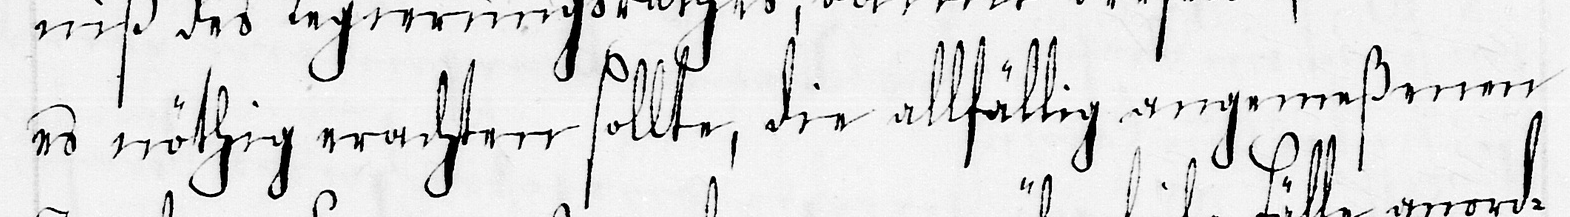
es nöthig erachten sollte, die allfällig angemeßenen
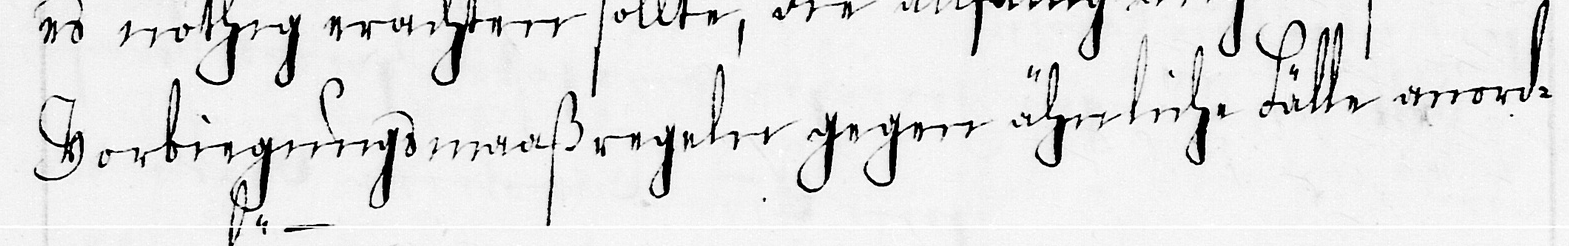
Vorbiegungsmaaßregeln gegen ähnliche Fälle anord¬
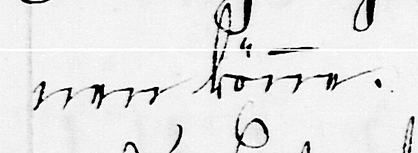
nen könne.
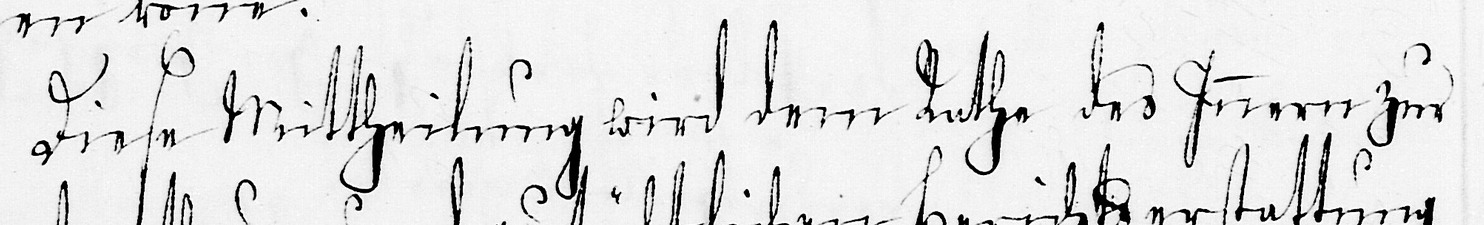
Diese Mittheilung wird dem Rathe des Innern zur
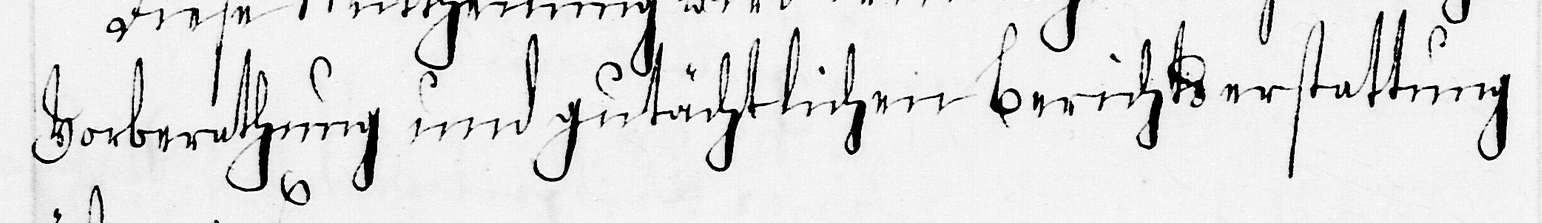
Vorberathung und gutächtlichen Berichtserstattung
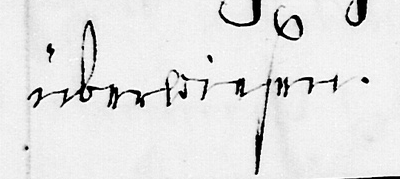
überwiesen.
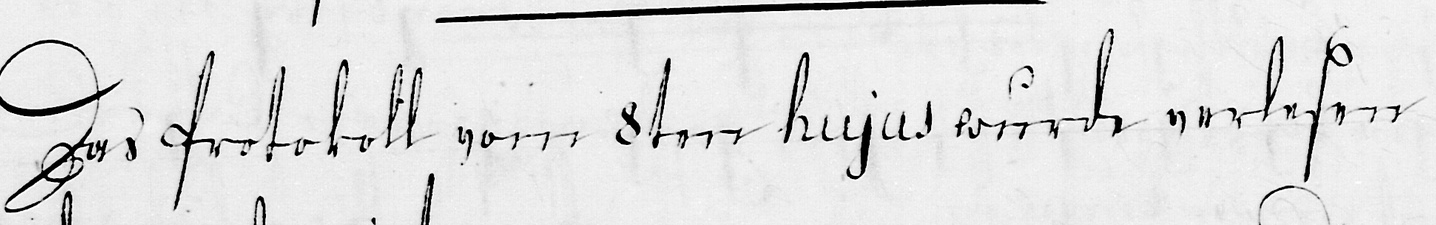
Das Protokoll vom 8ten hujus wurde verlesen
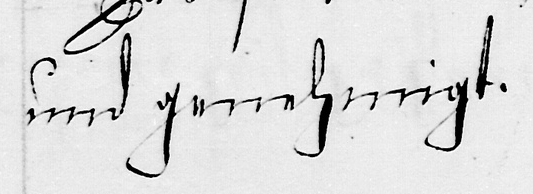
und genehmigt.
